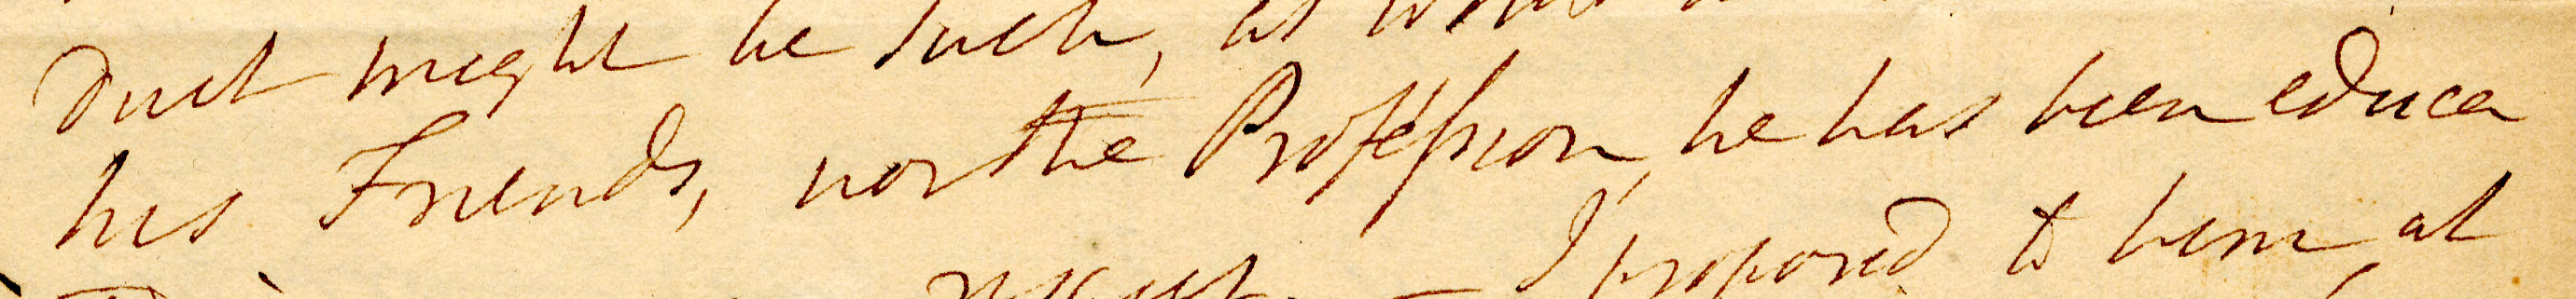his Friends, nor the Profession, he has been educa
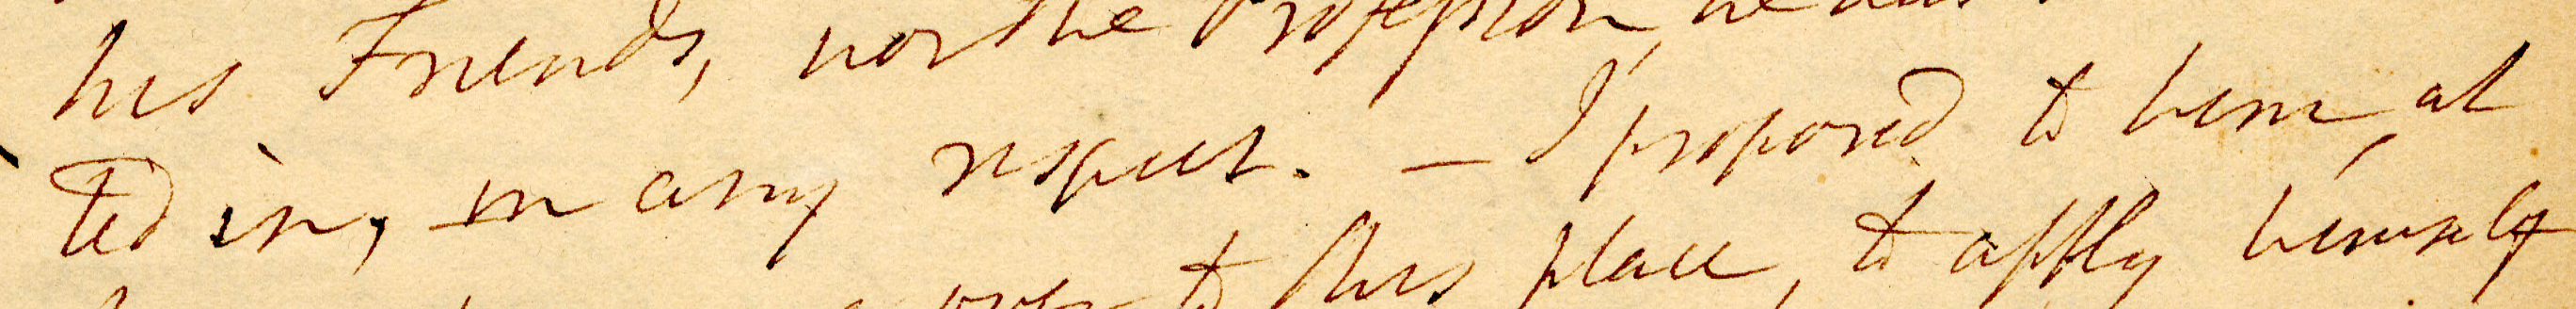ted in, in any respect.- I proposed to him, at
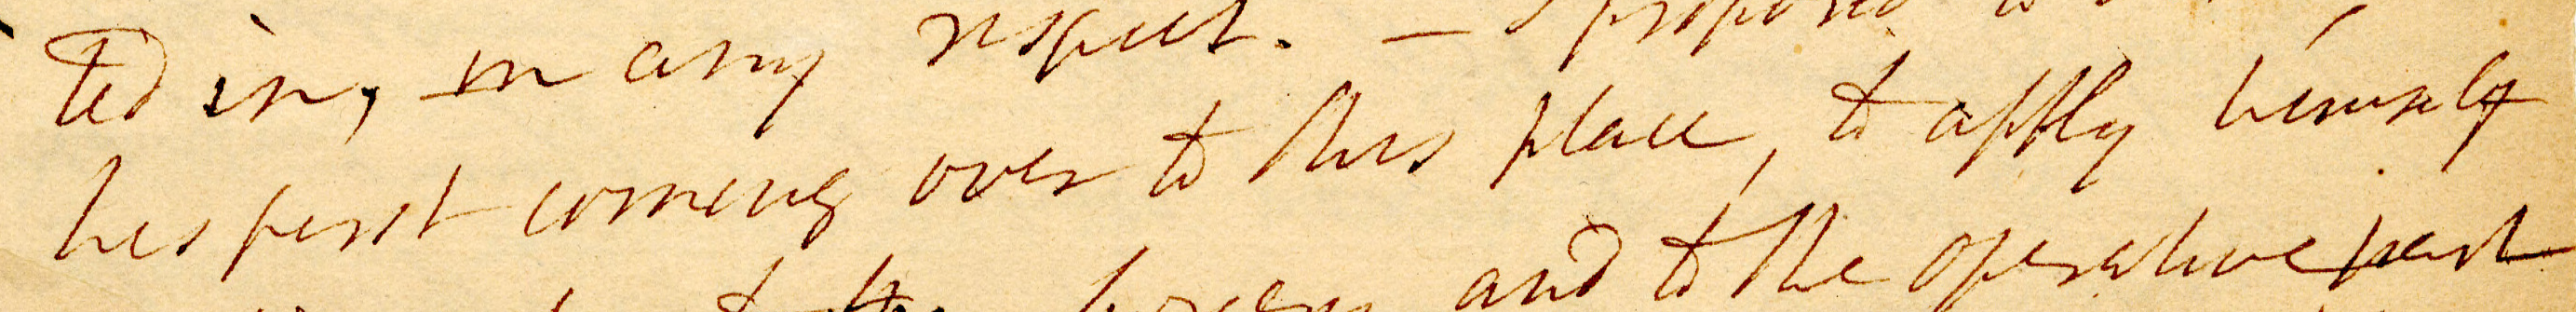his first coming over to this place, to apply himself
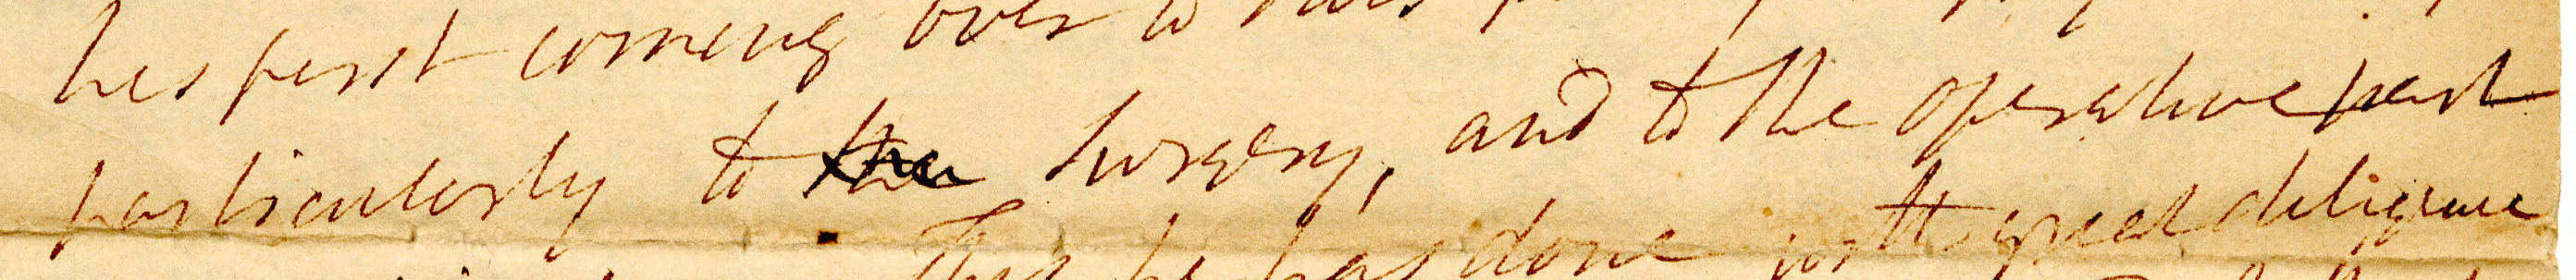particularly to the surgery, and to the operative part
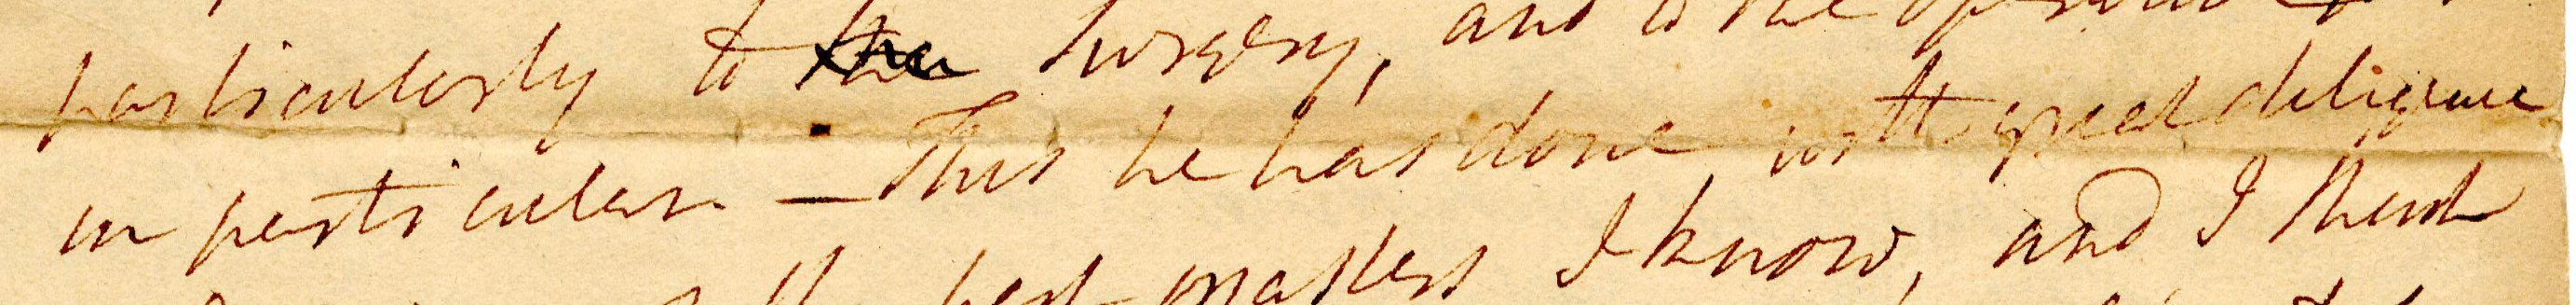in particular- This he has done with great diligence
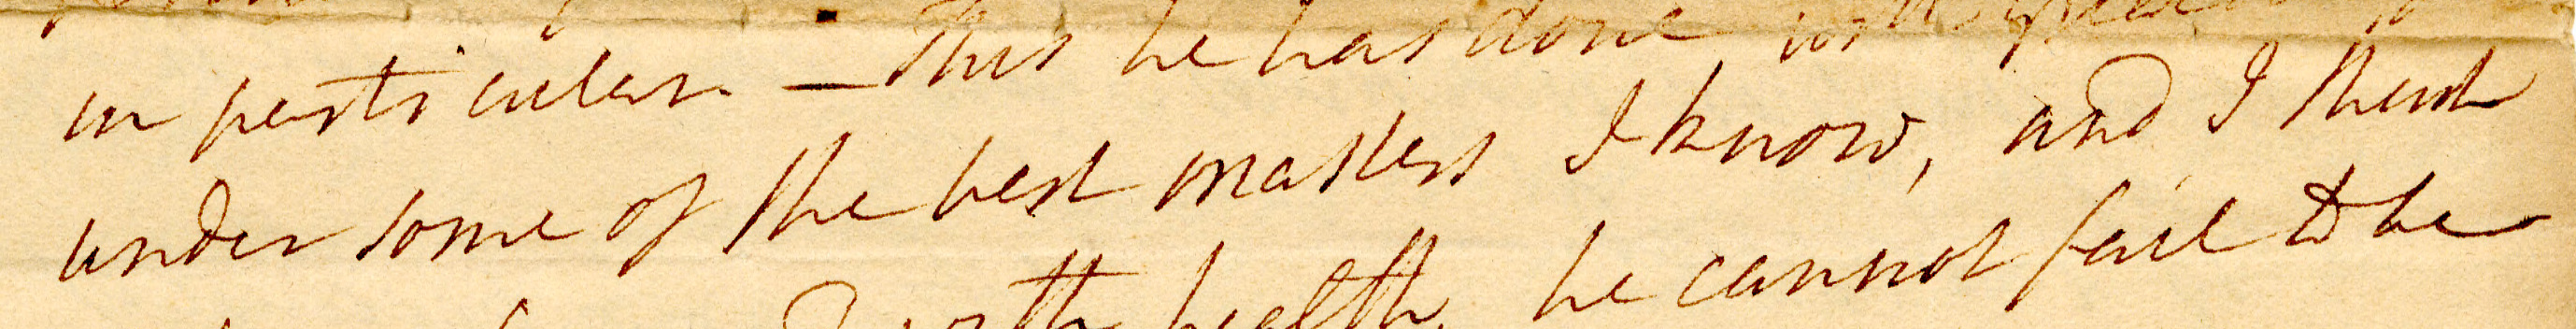under some of the best marks I know, and I think
